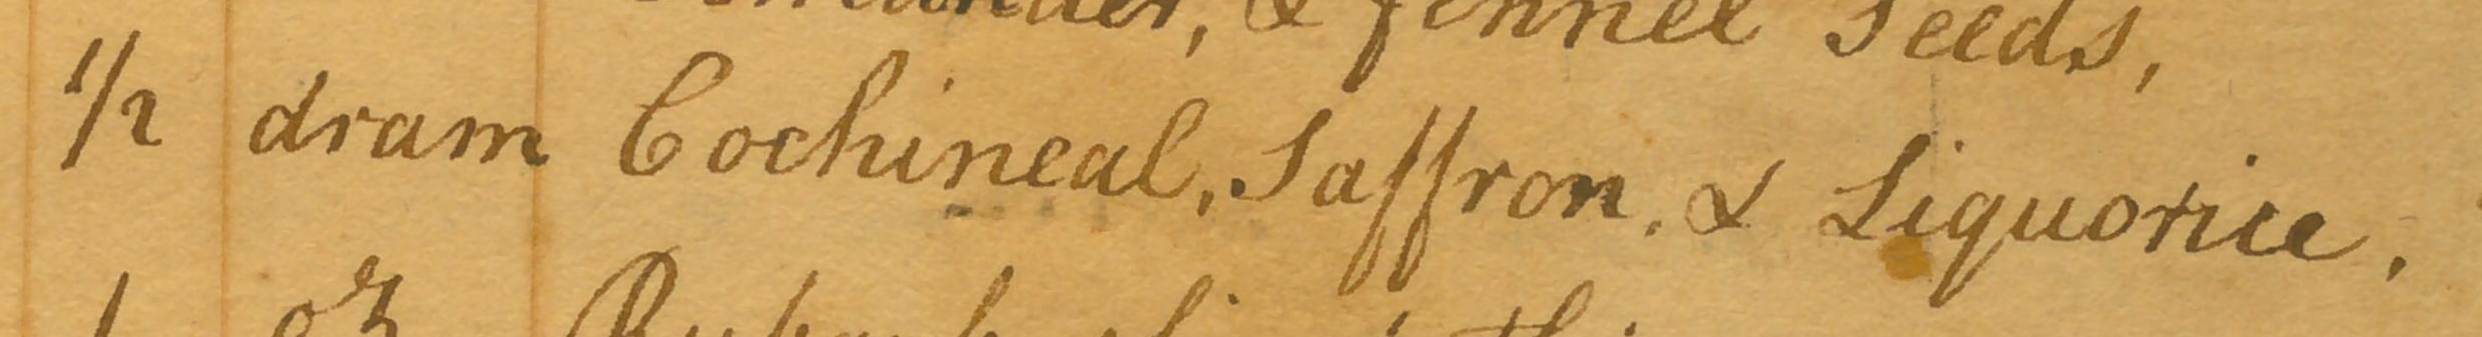1/2 dram Cochineal, & Liquorice.
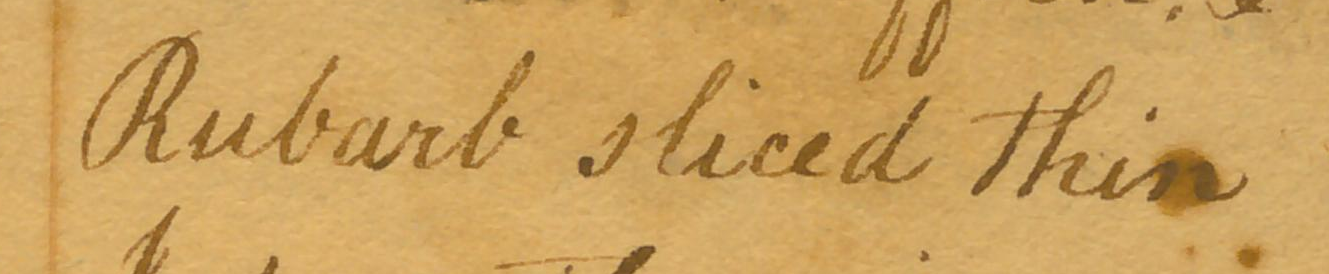Rubarb sliced thin
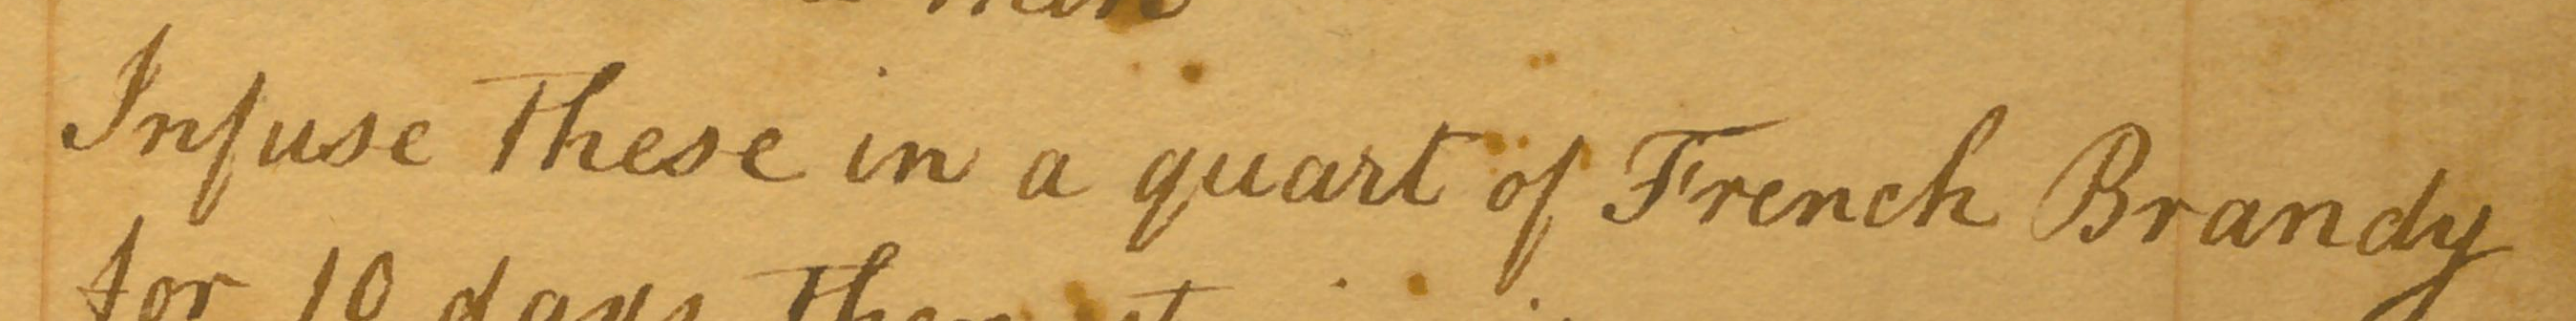Infuse These in a quart of French Brandy
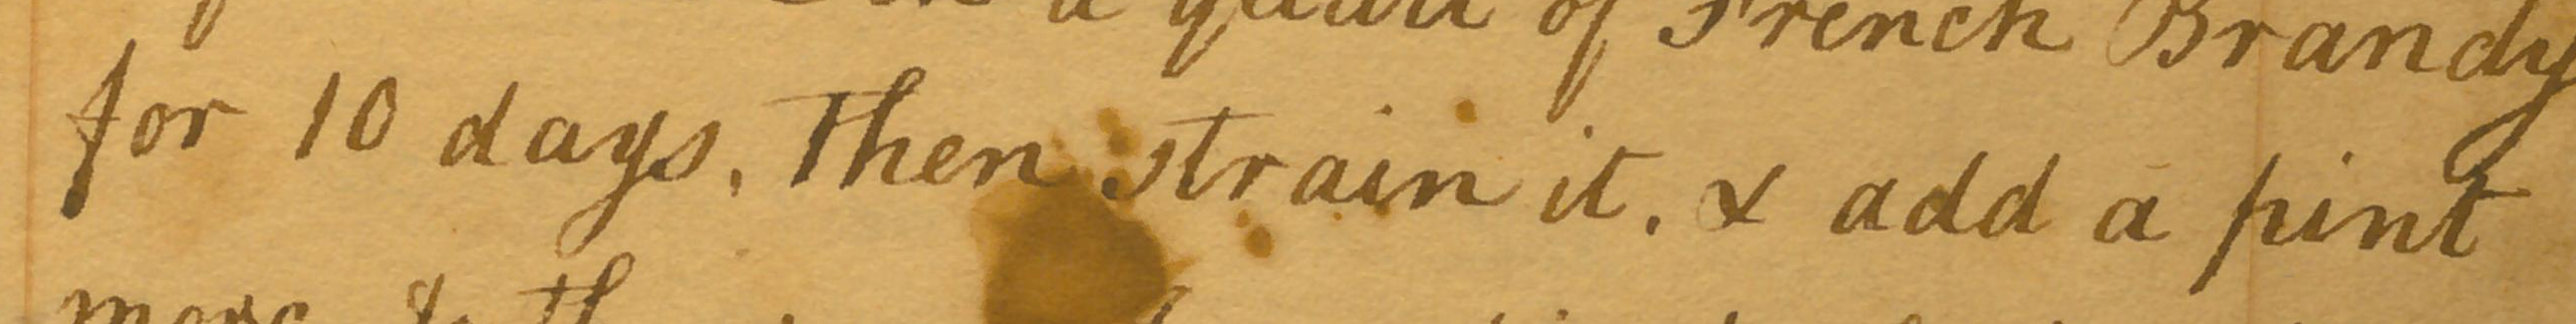for 10 days. Then strain it. & add a pint
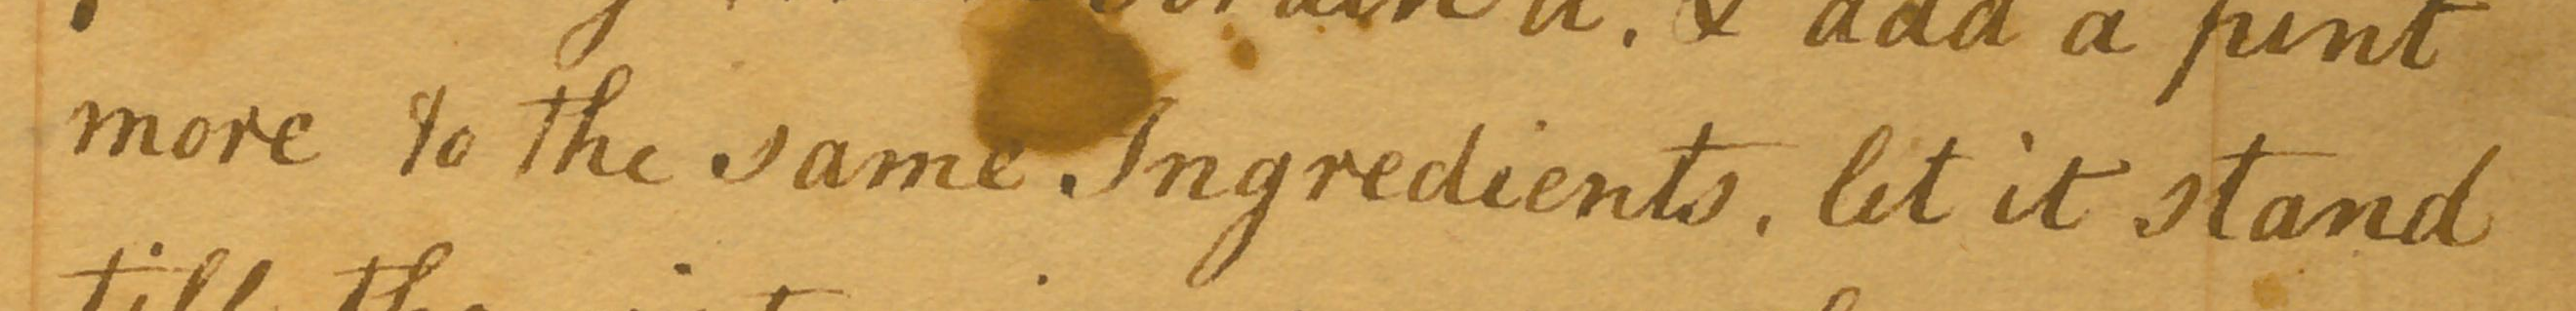more to the same Ingredients. let it stand
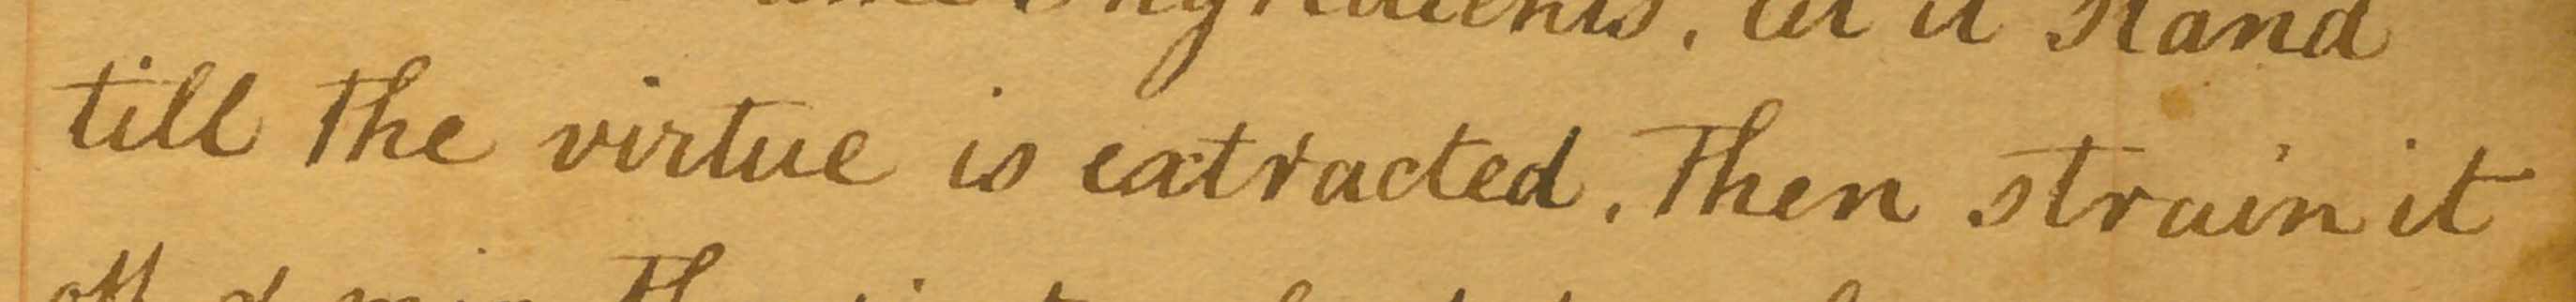till the virtue is extracted. Then strain it
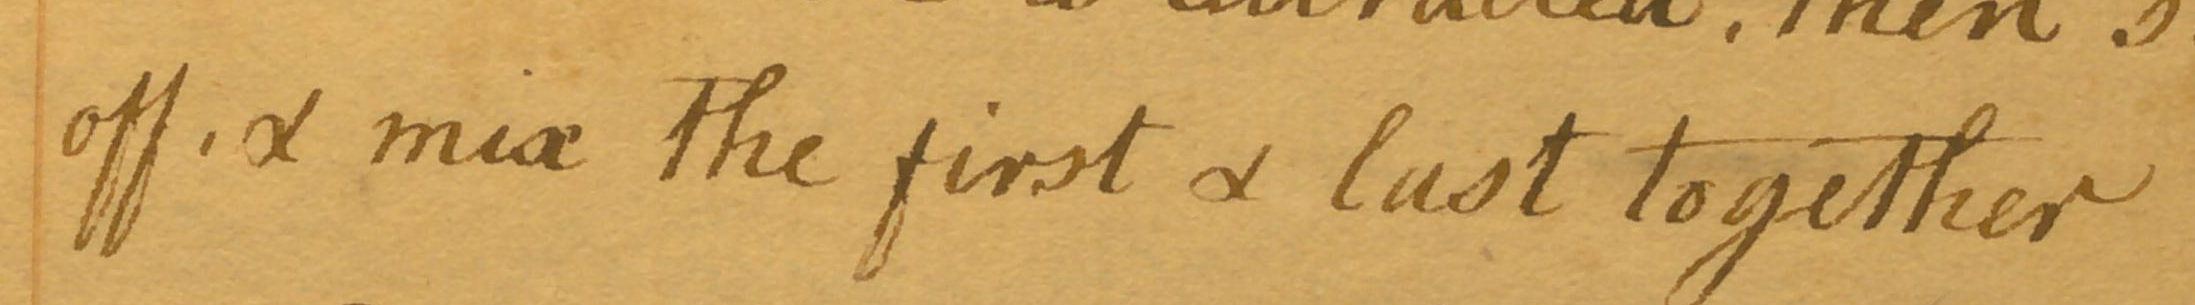off, & mix the first & last together
